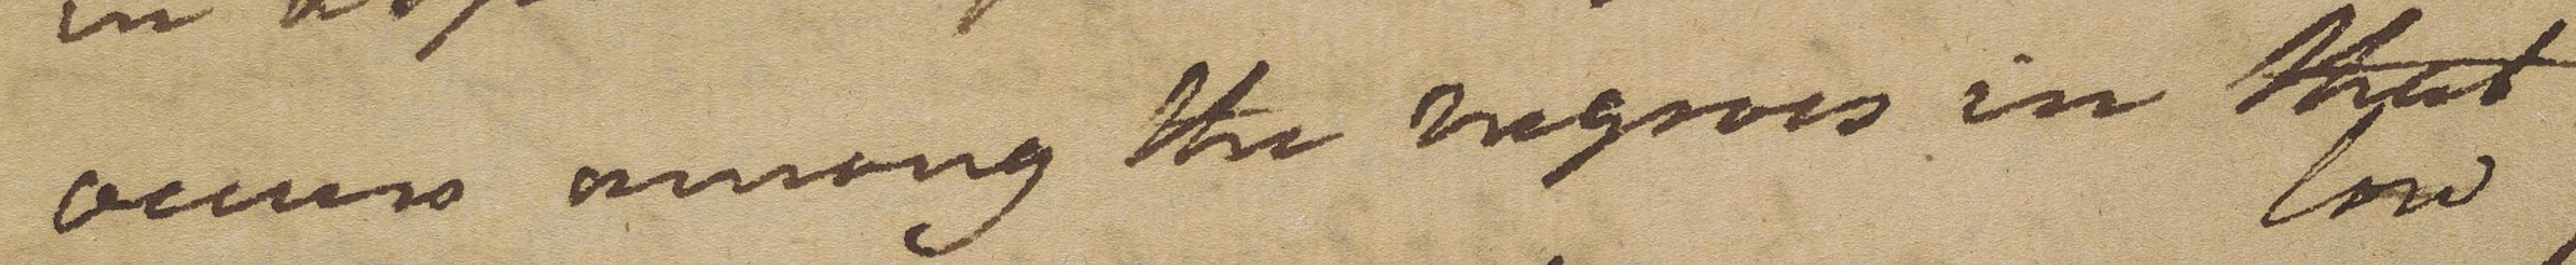occurs among the Negroes in that
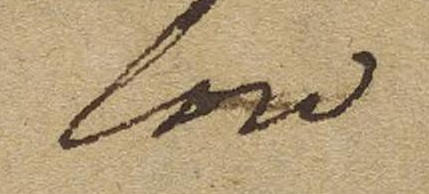low
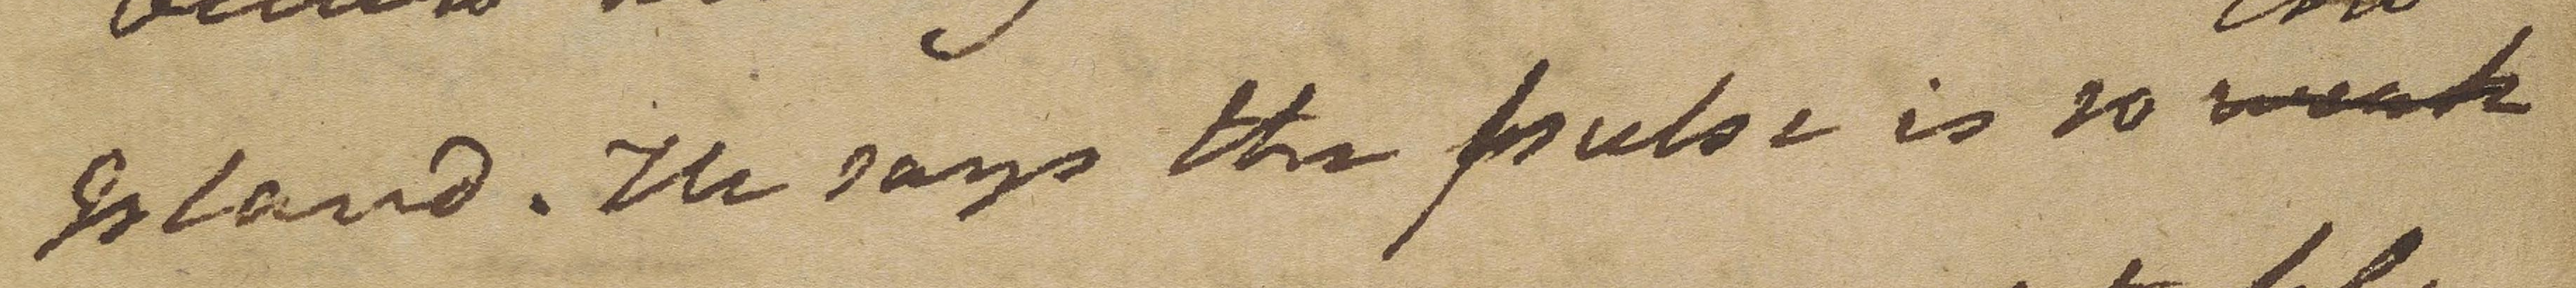Island. He says the pulse is so [weak]
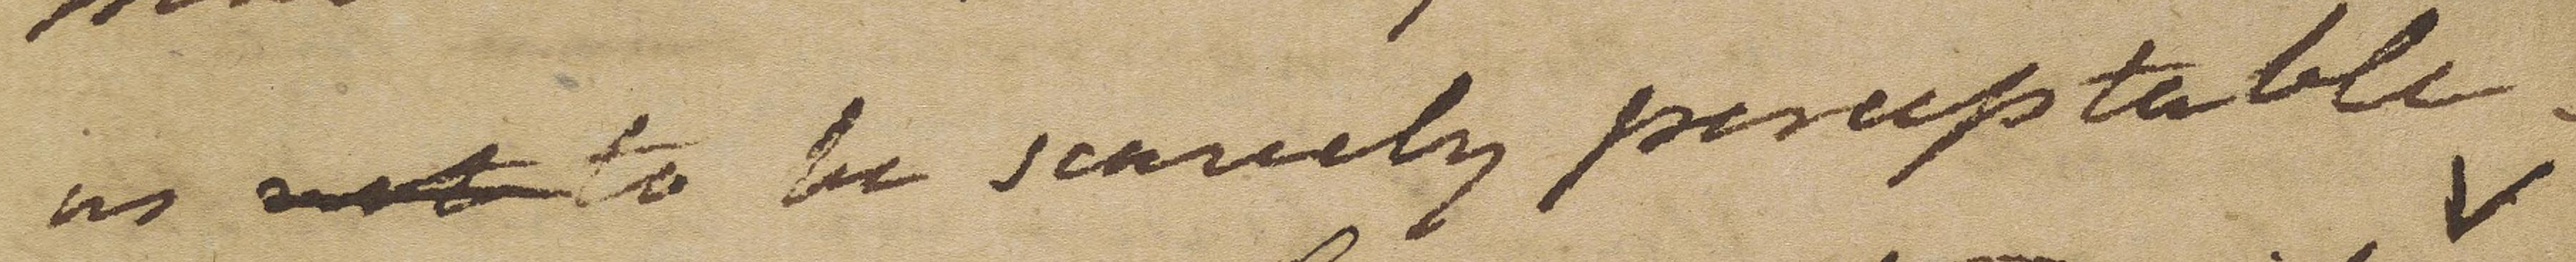as [not] to be scarcely perceptable
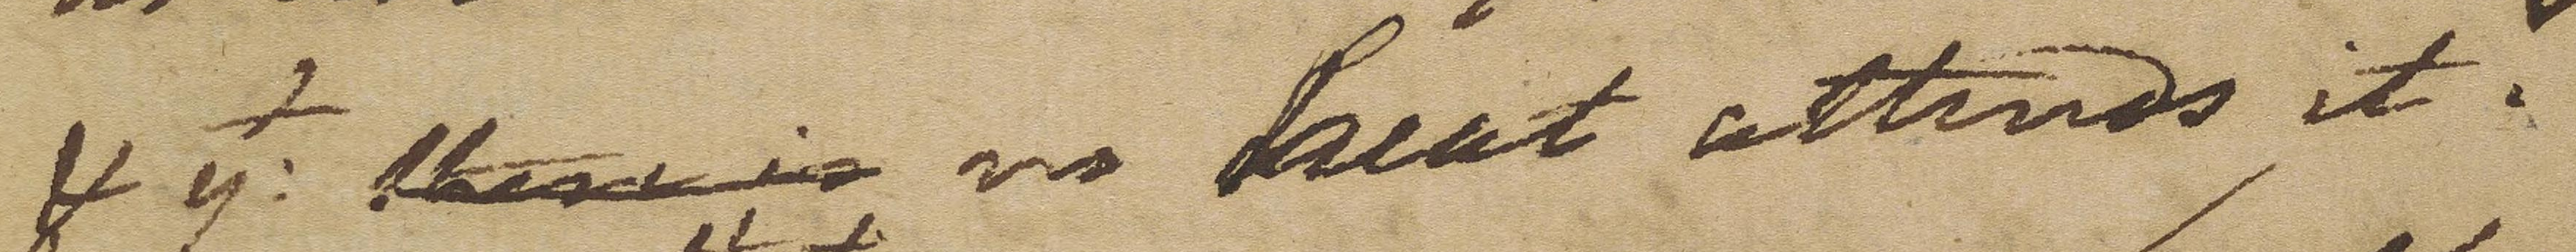& y^t [there is] no heat attends it. V
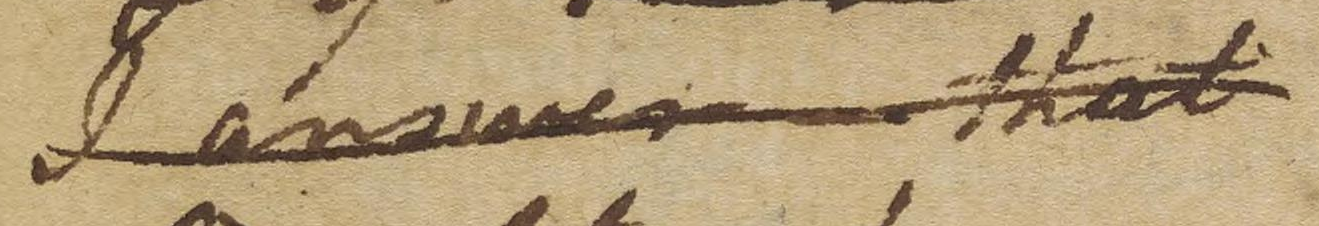[I answer that]
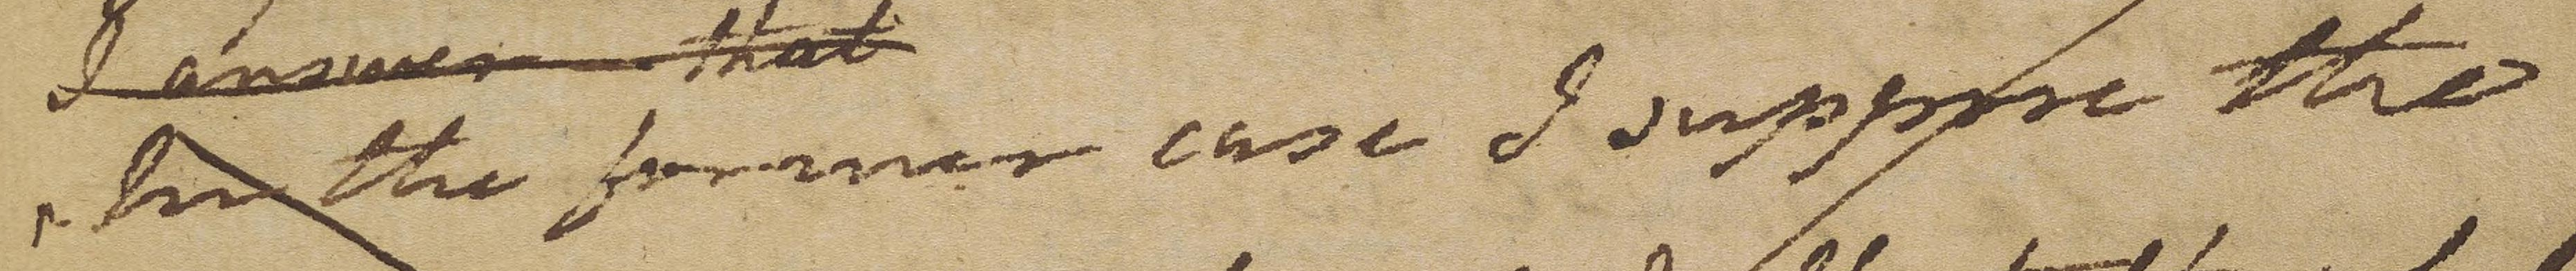In the former case I suppose the
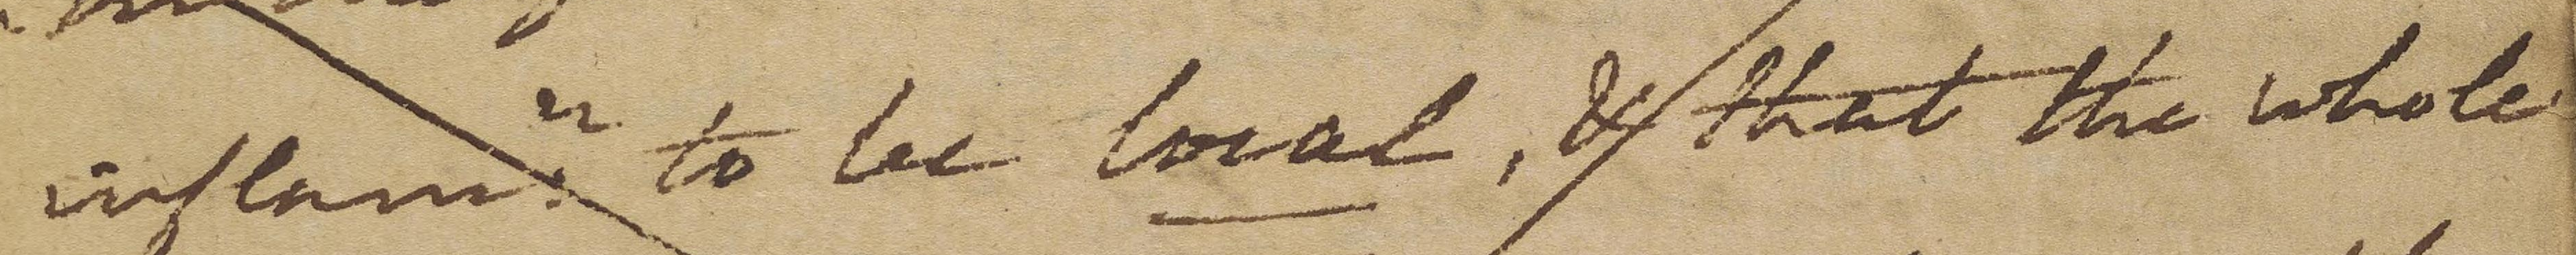inflam^n to be local, & that the whole
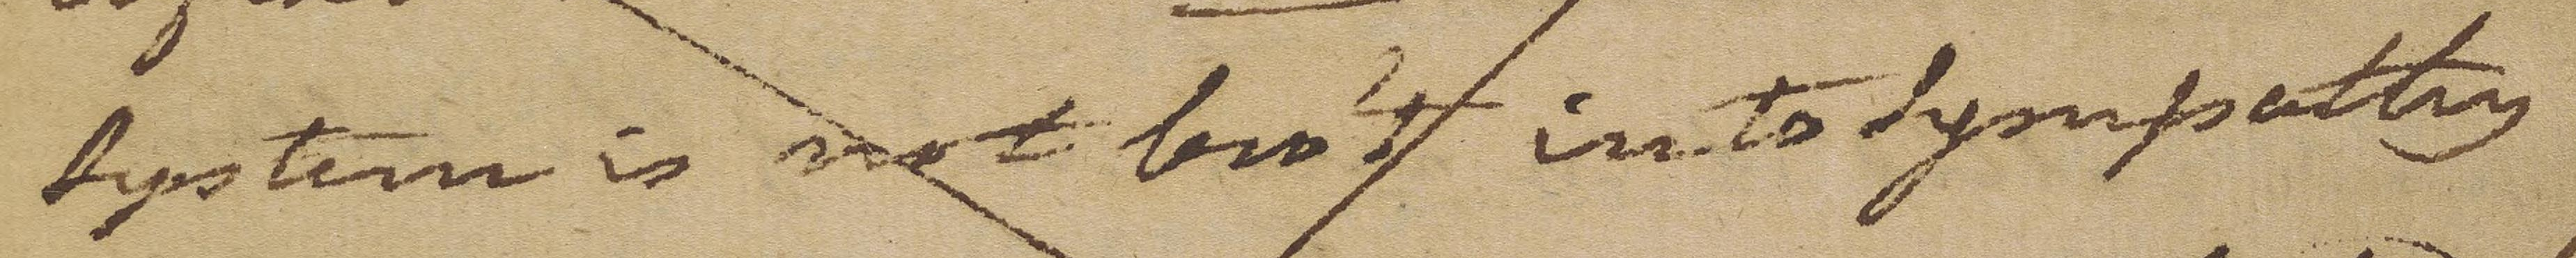System is not bro't into Sympathy
